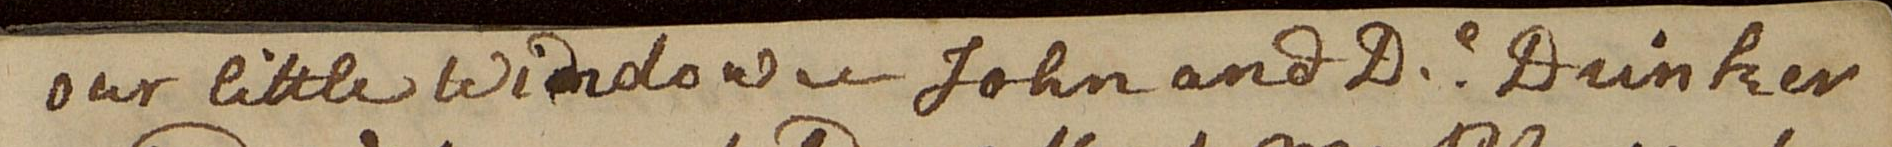our little Window - John and D^l. Drinker
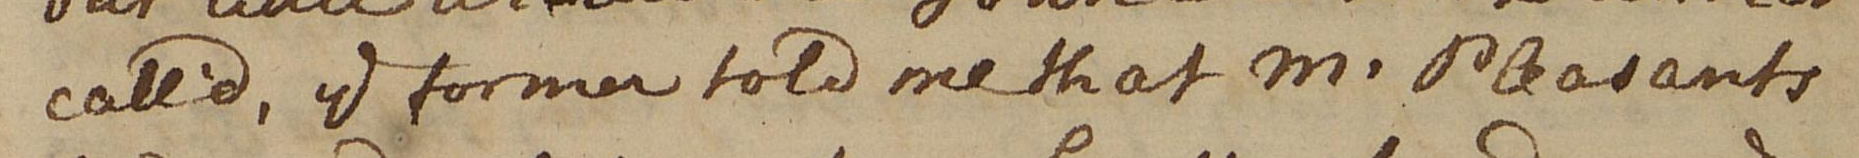calld, y^e former told me that M. Pleasants
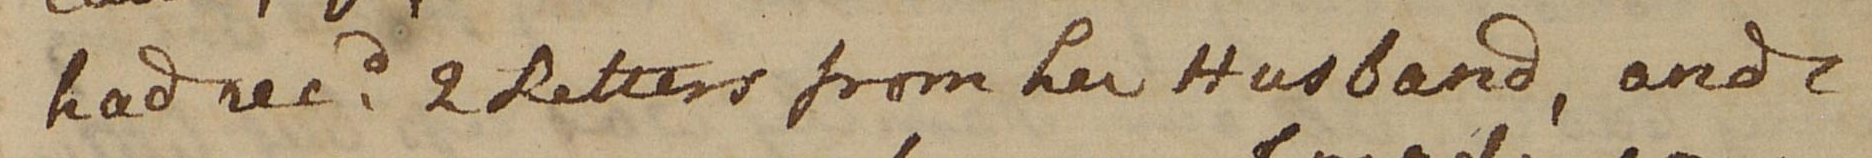had rec^d 2 Letters from her Husband, and
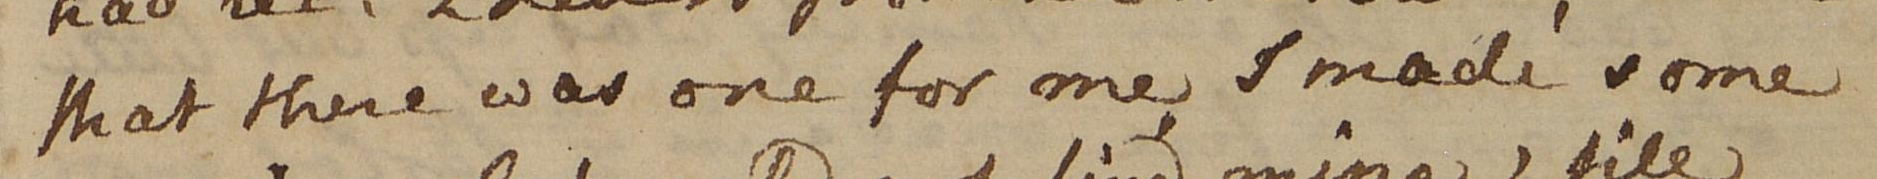that there was one for me I made some
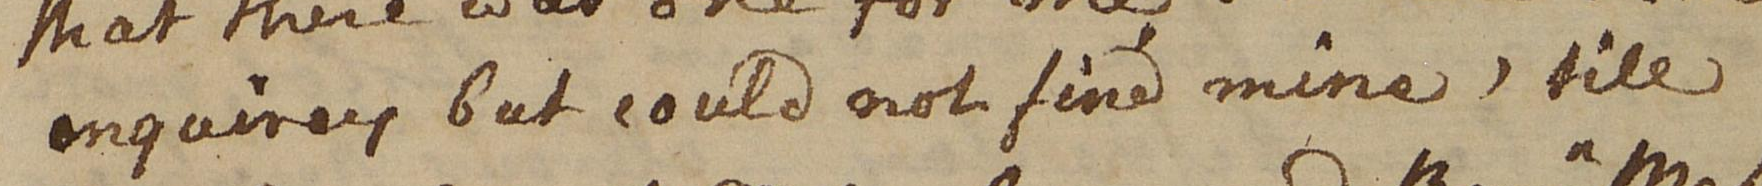enquirey but could not find mine , till
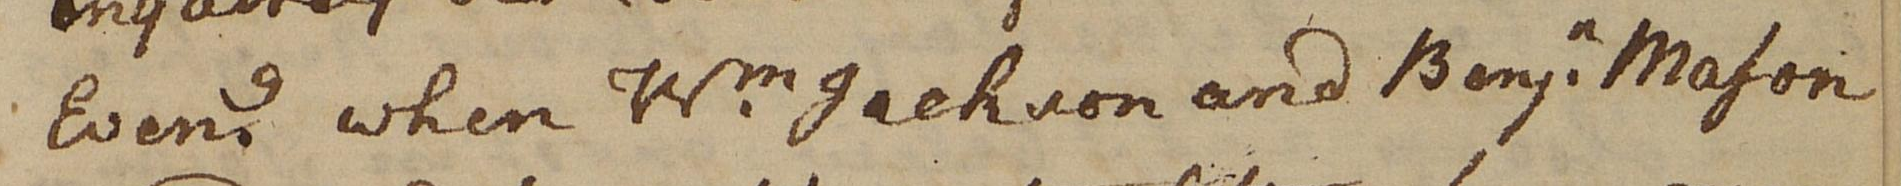Even^g. when W^m. Jackson and Benj^n. Mason
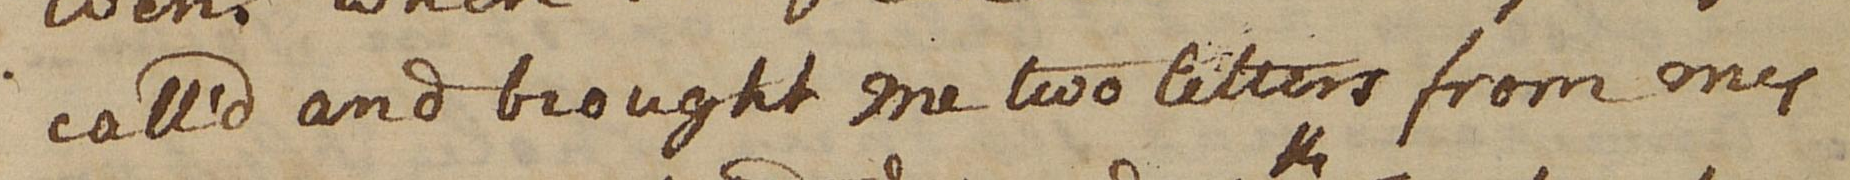call'd and brought me two letters from my
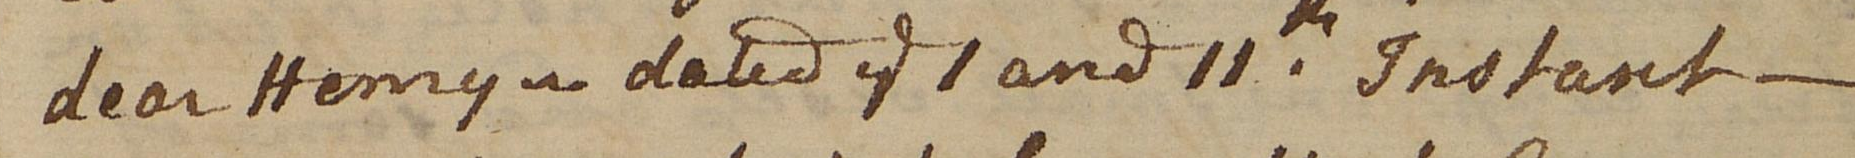dear Henry - dated y^e 1 and 11^h. Instant-
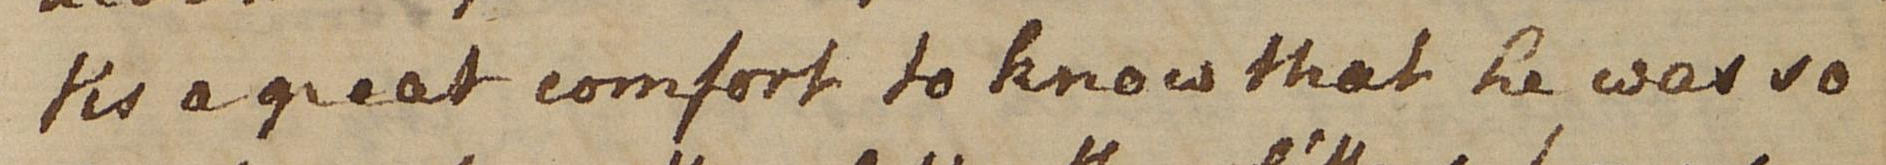tis a great comfort to know that he was so
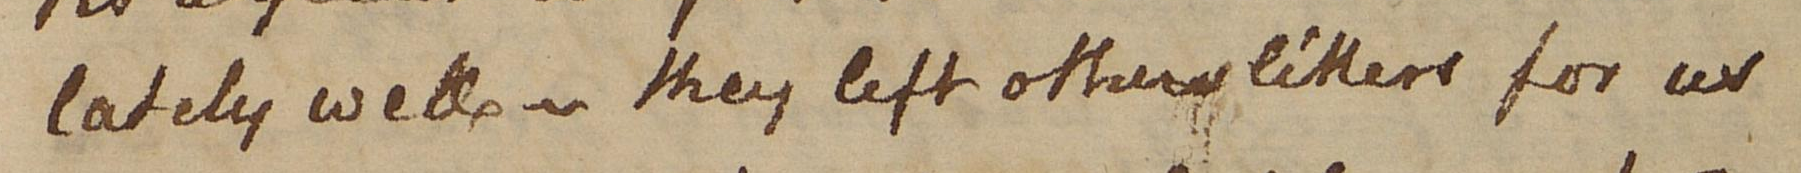lately well- they left other litters for us
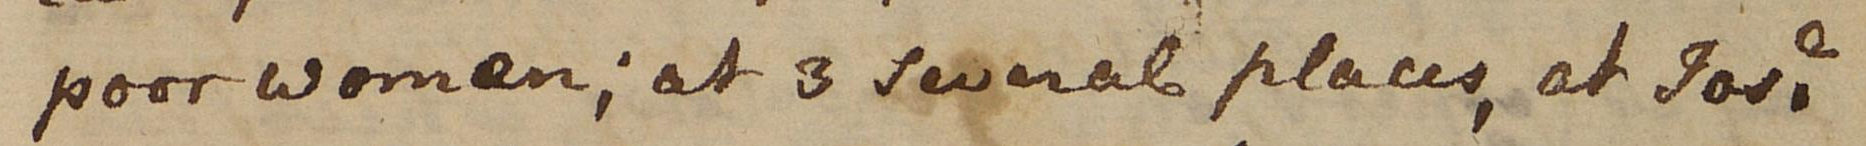poor women; at 3 several places, at Jos^l.
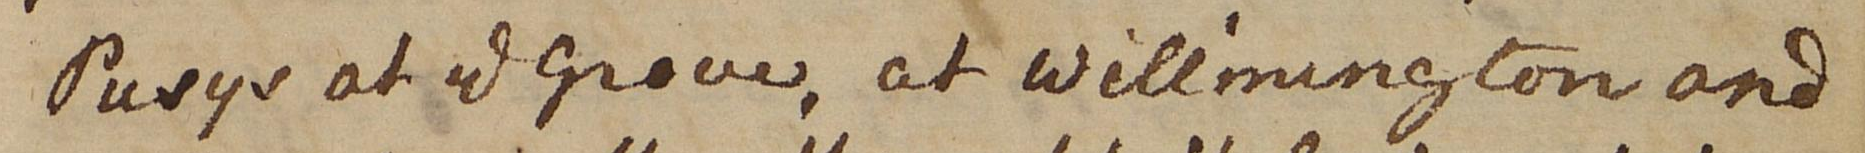Pusys at y^e Grove, at Willmington and
